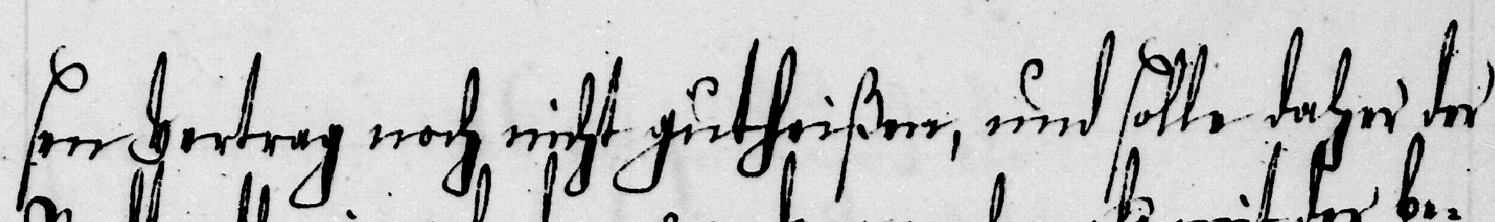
sen Vertrag noch nicht gutheißen, und soll daher d¬
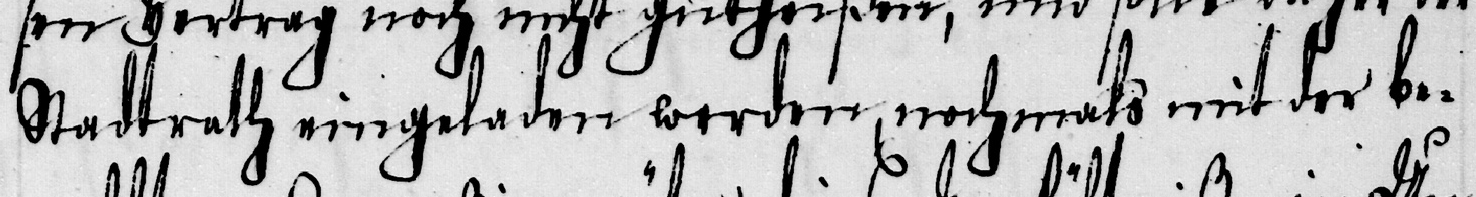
Stadtrath eingeladen werden nochmals mit der be¬
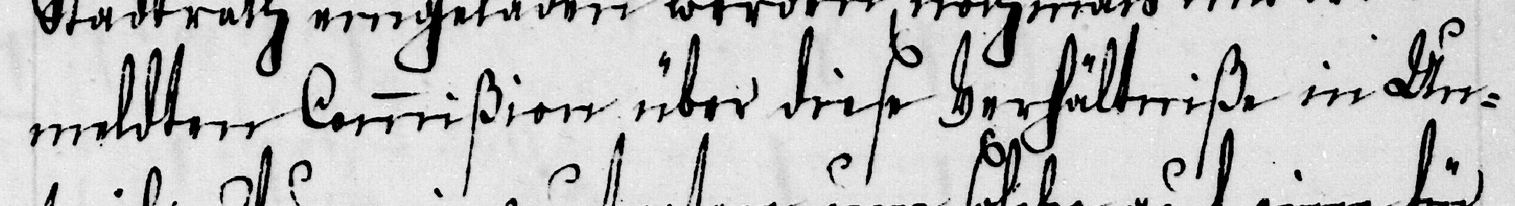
meldten Commißion über diese Verhältniße in Un¬
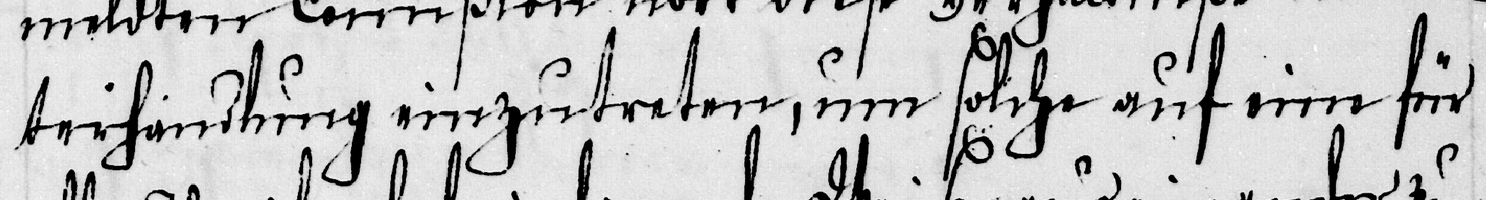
terhandlung einzutreten, um solche auf eine für
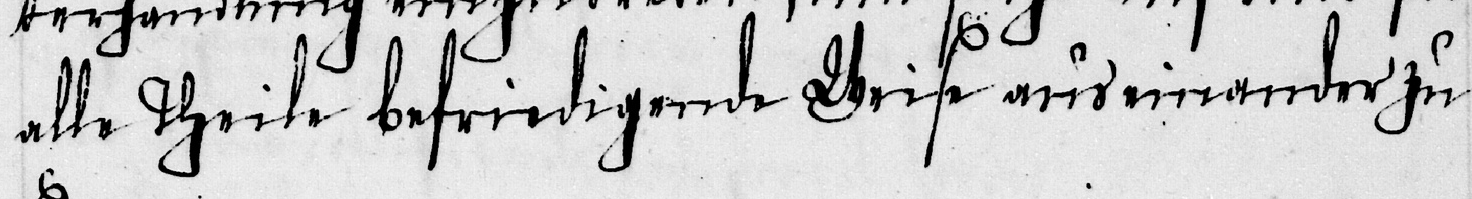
alle Theile befriedigende Weise auseinander zu
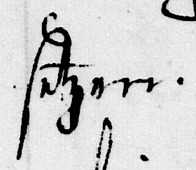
setzen.
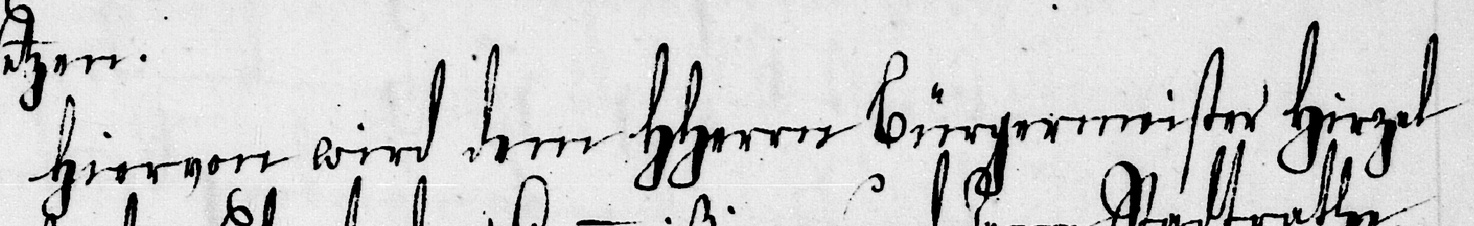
Hiervon wird dem HHerrn Bürgermeister Hirzel
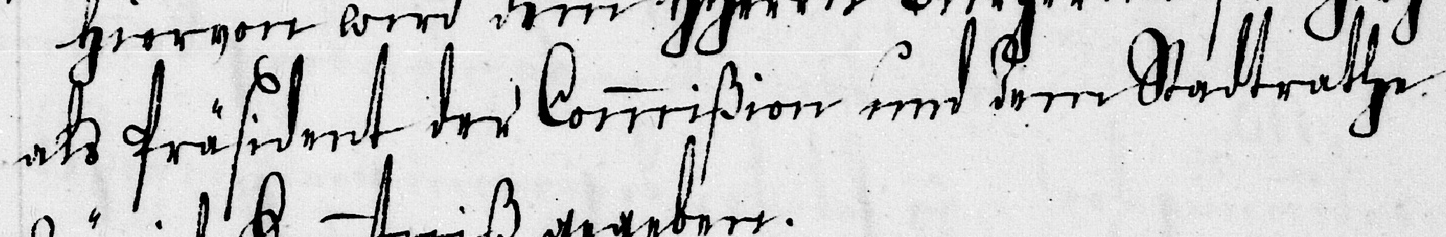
als Präsident der Commißion und dem Stadtrathe
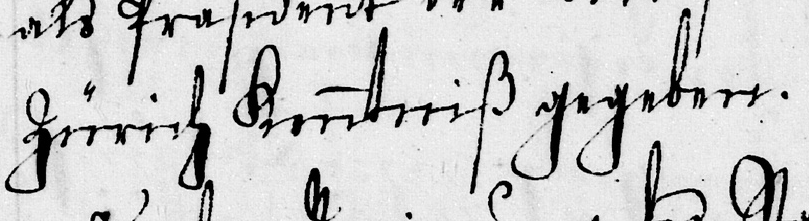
Zürich Kenntniß gegeben.
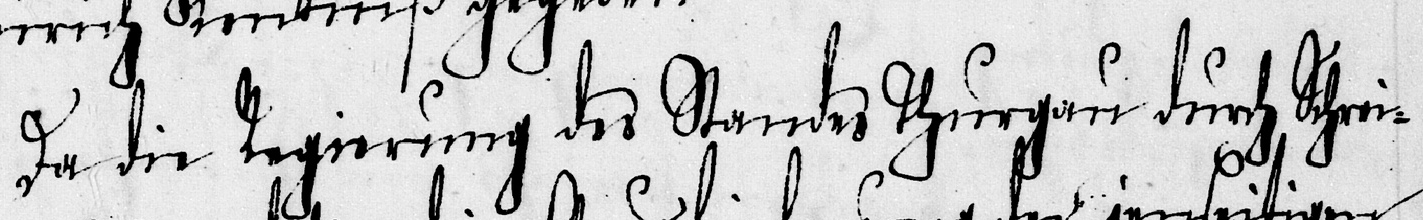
Da die Regierung des Standes Thurgau durch Schre¬
